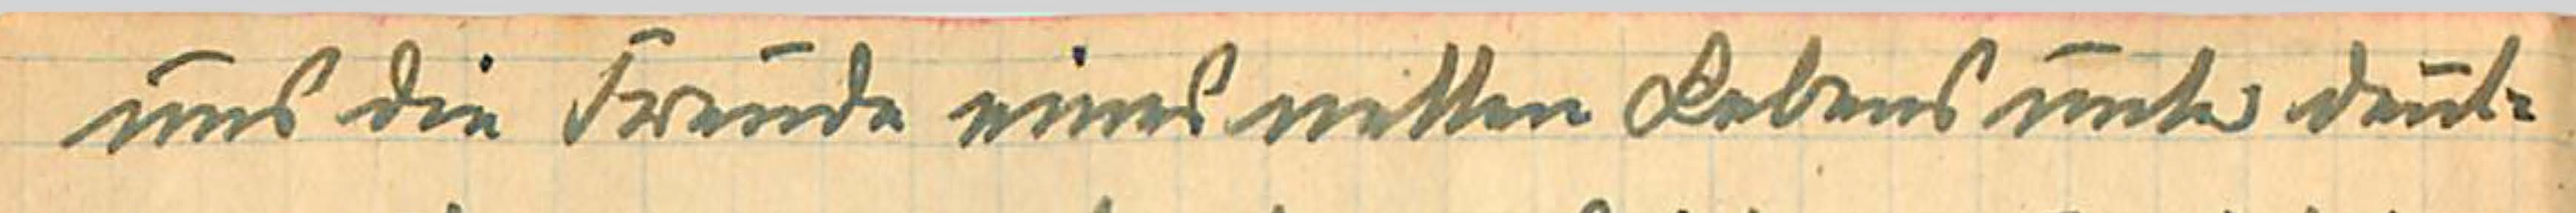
uns die Freude eines netten Lebens unter deut-
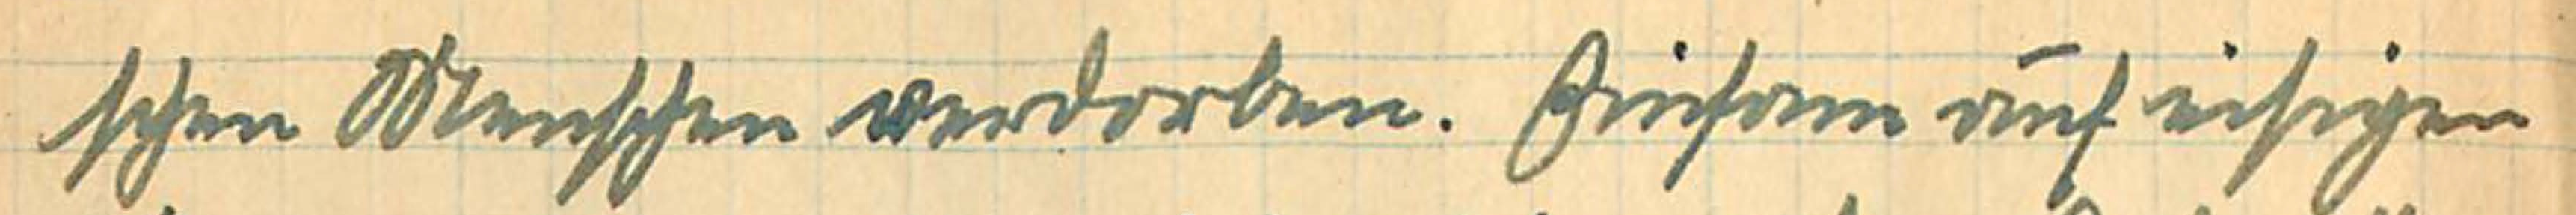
schen Menschen verdorben. Einsam auf eisigen
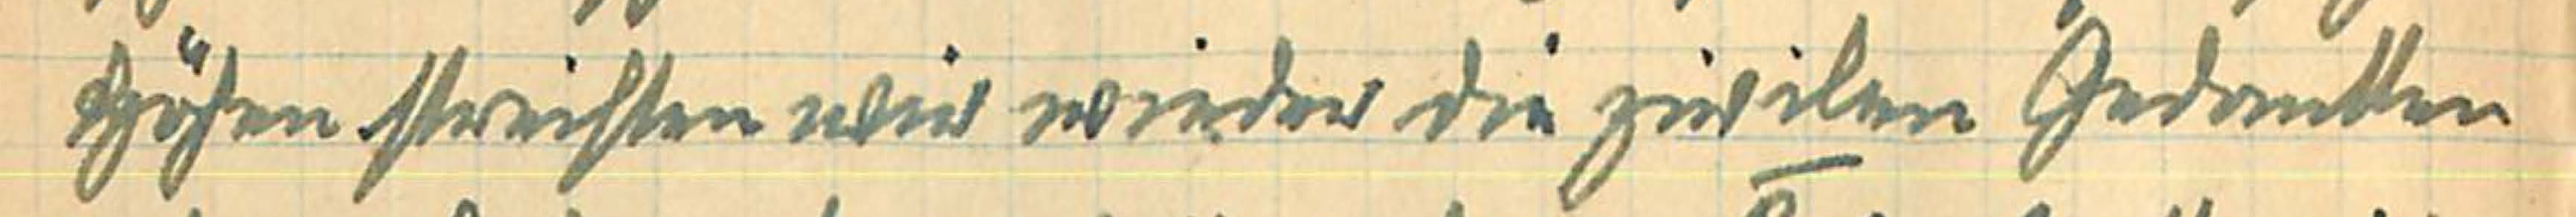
Höhen streiften wir wieder die zivilen Gedanken
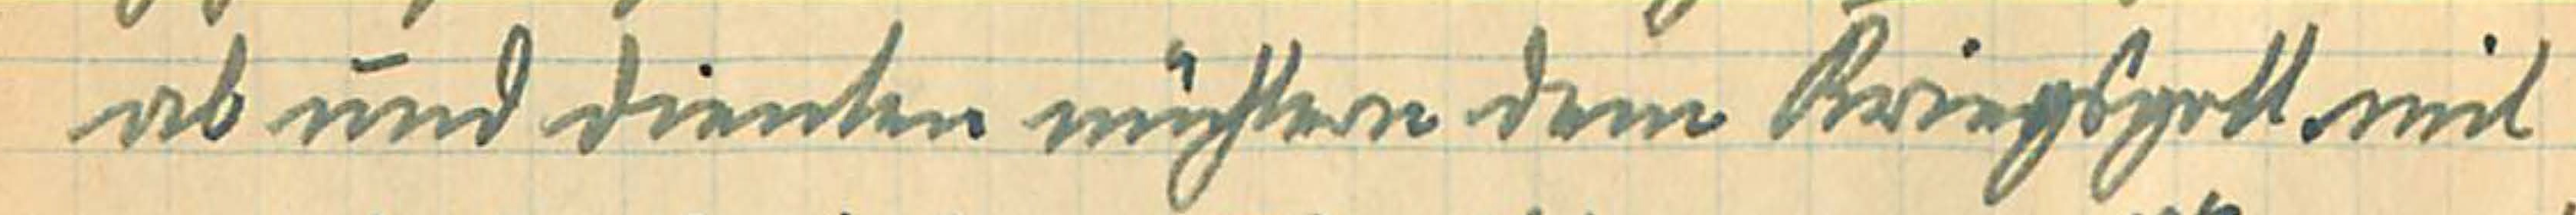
ab und dienten nüchtern dem Kriegsgott mit
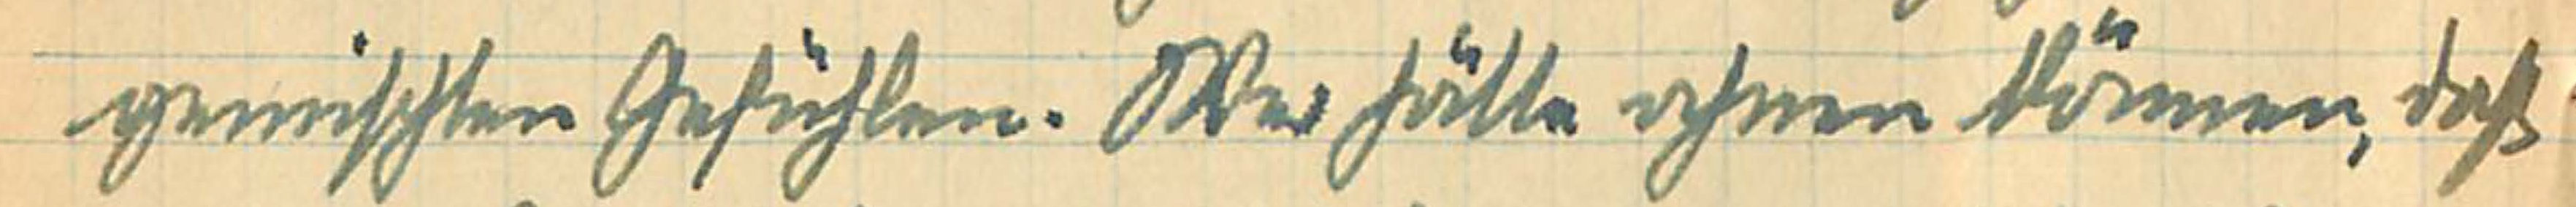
gemischten Gefühlen. Wer hätte ahnen können, daß
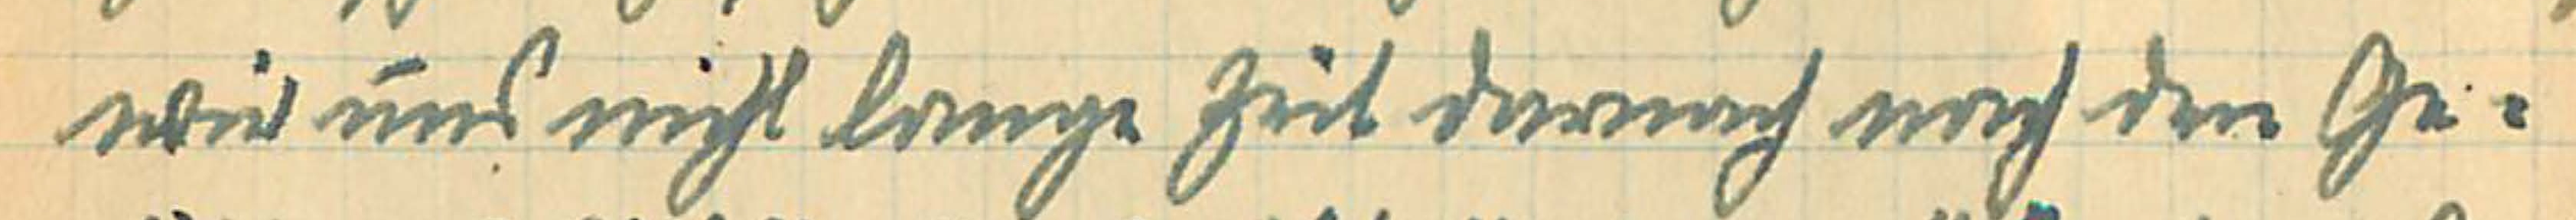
wir uns nicht lange Zeit danach nach den Ge-
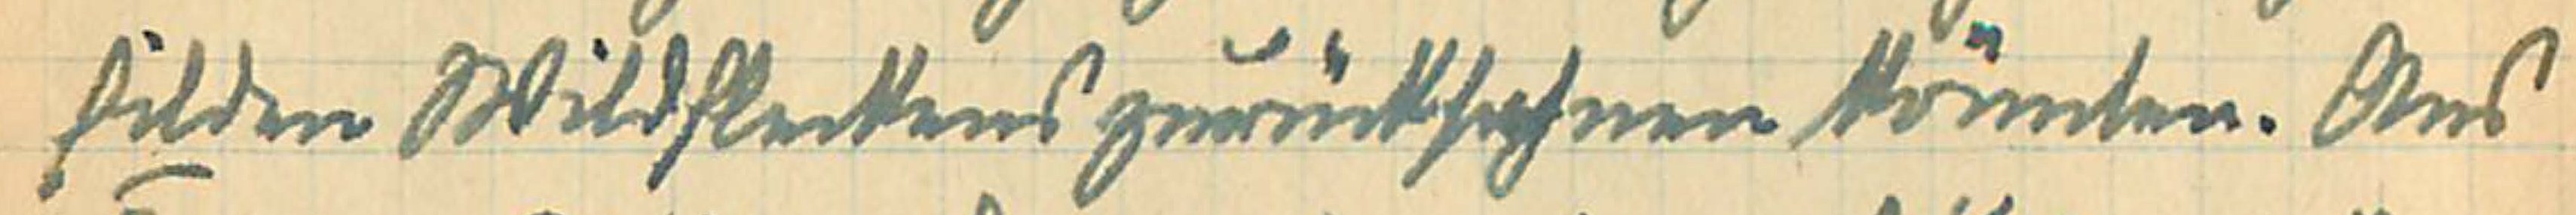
filden Wildfleckens zurücksehnen könnten. Ans
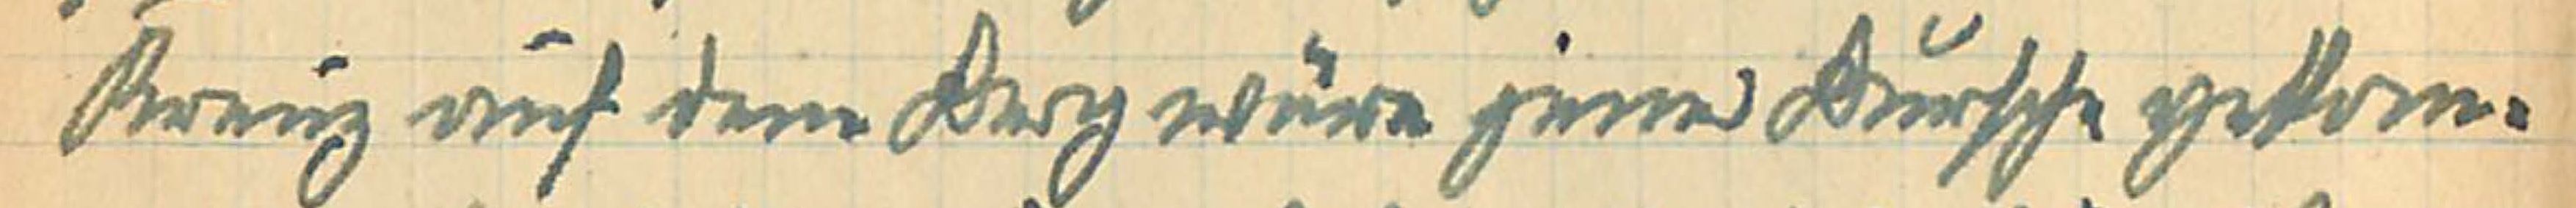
Kreuz auf dem Berg wär jener Bursche gekom-
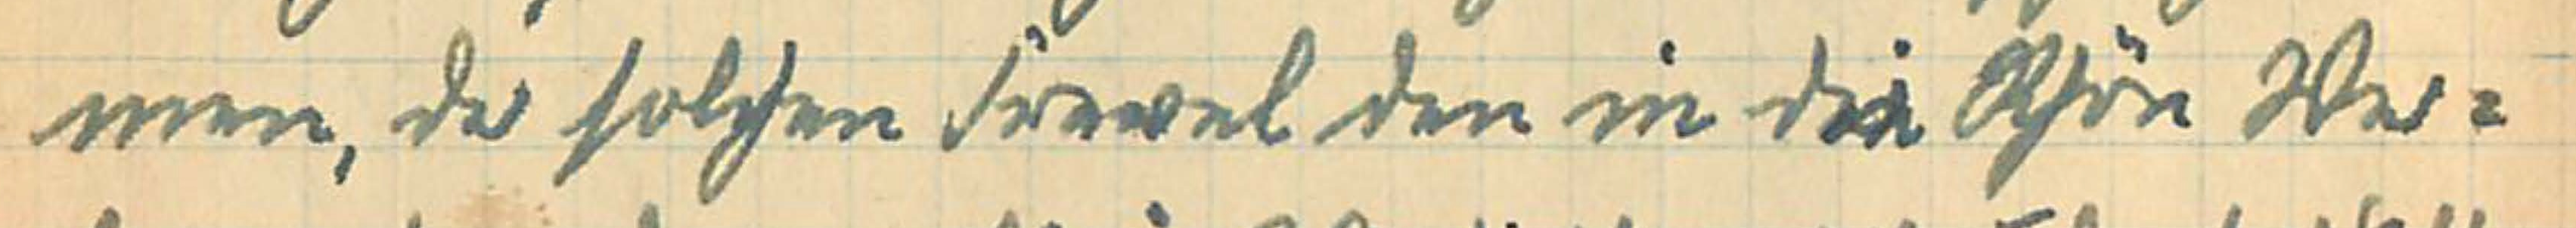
men, der solchen Frevel den in die Rhön Ver-
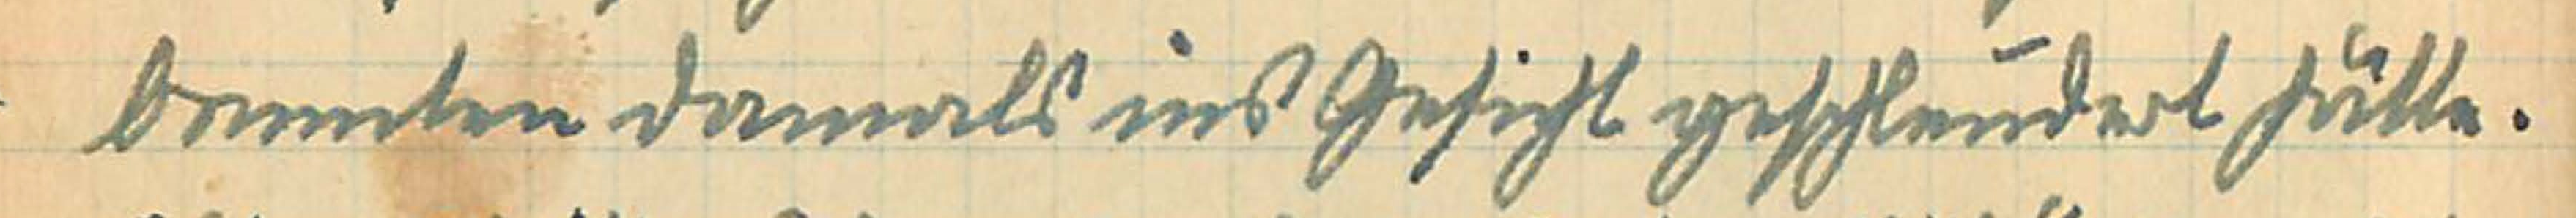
bannten damals ins Gesicht geschleudert hätte.
